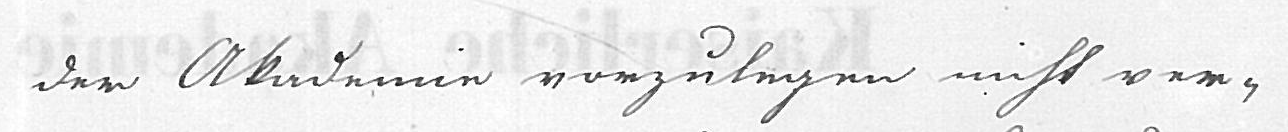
der Akademie vorzulegen nicht ver-
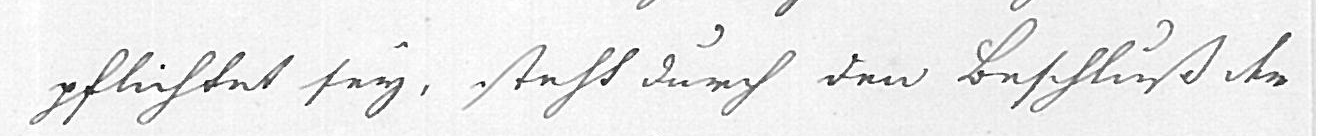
Pflichtet sey, steht durch den Beschluß der
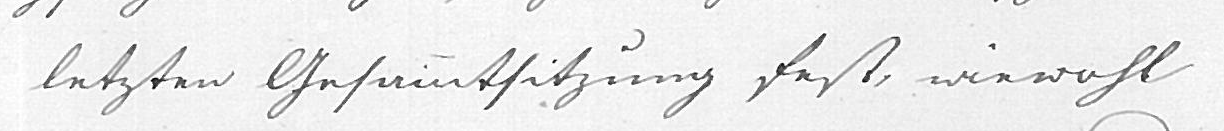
letzten Gesammtsitzung fest, wiewohl
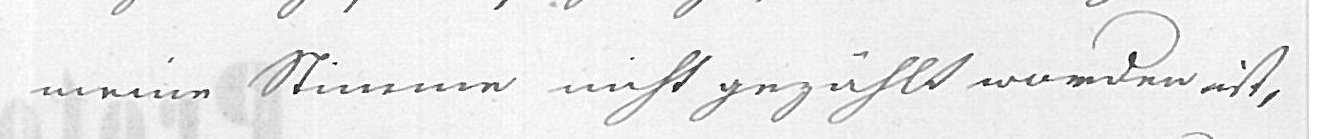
meine Stimme nicht gezählt worden ist,
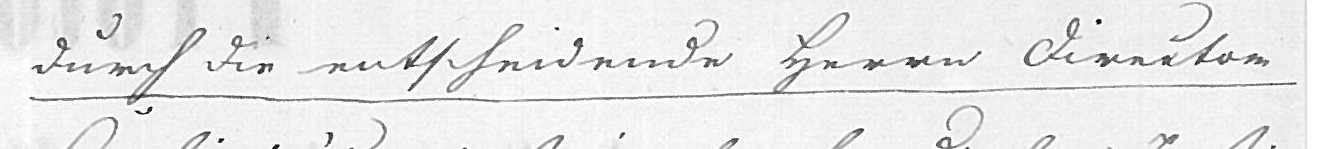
durch die entscheidene Herrn Director
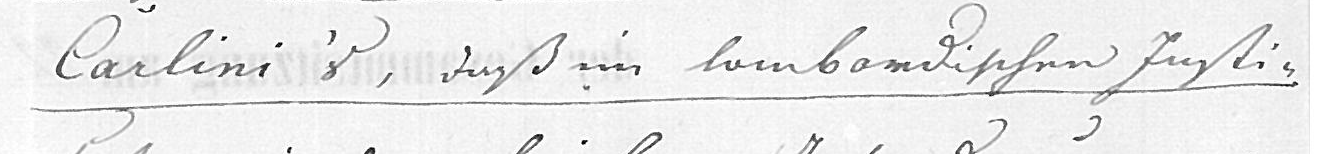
Carlini's, daß im lombardischen Insti-
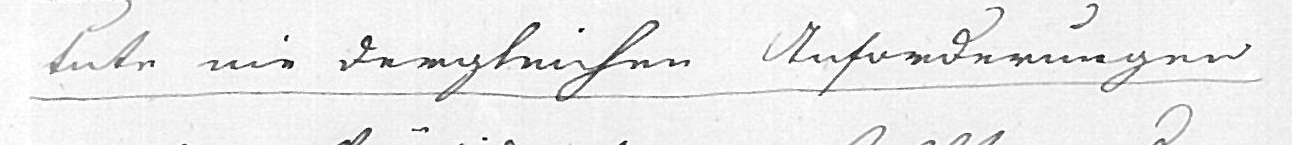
tute nie dergleichen Anforderungen
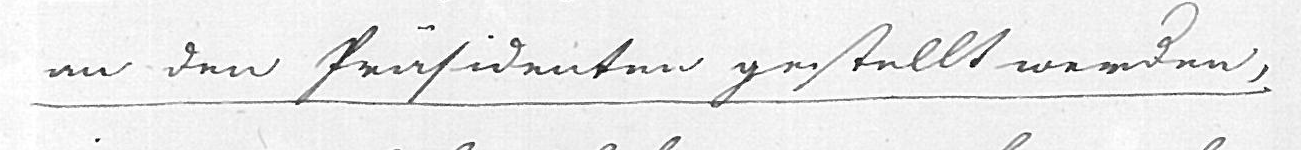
von den Präsidenten gestellt werden,
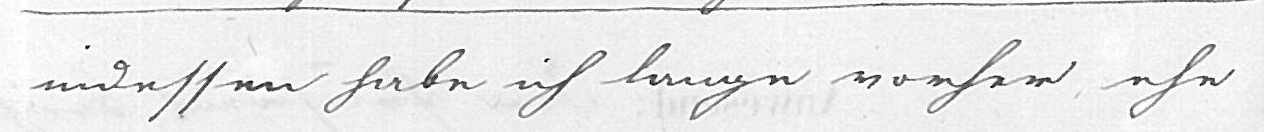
indessen habe ich lange vorher, ehe
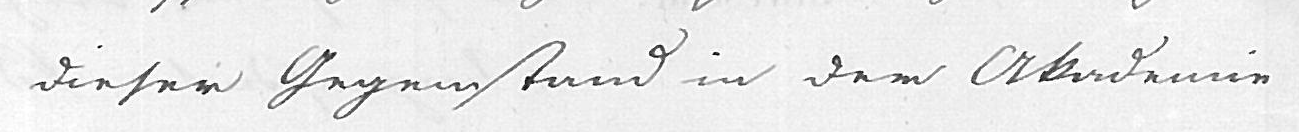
dieser Gegenstand in der Akademie
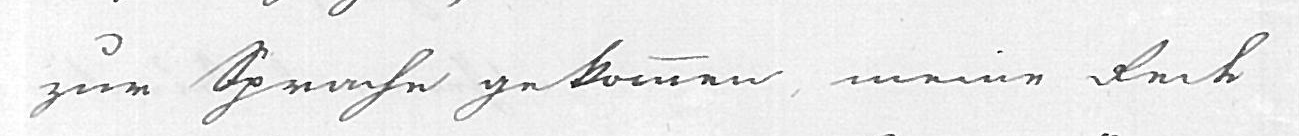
zur Sprache gekommen, meine Rede
